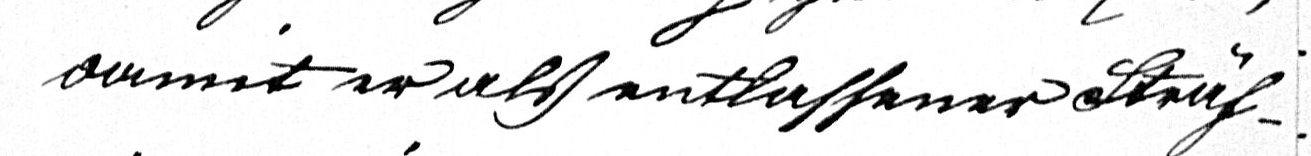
damit er als entlassener Sträf¬
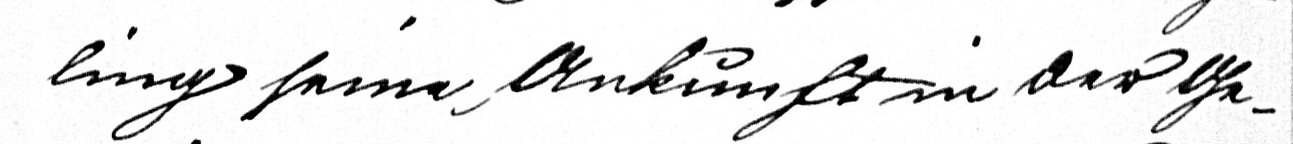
ling seine Ankunft in der Ge¬
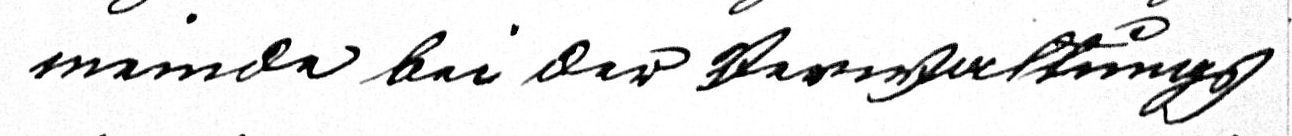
meinde bei der Verwaltungs
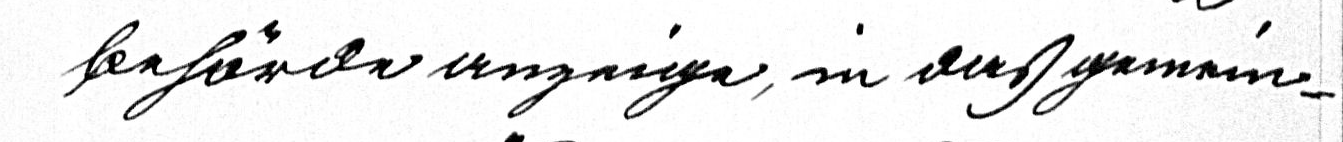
behörde anzeige, in das gemein¬
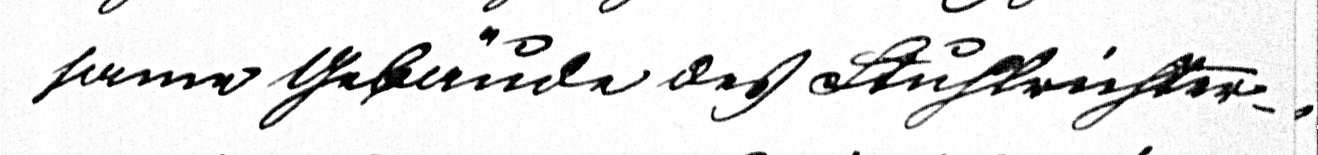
same Gebäude des Stuhlrichter¬
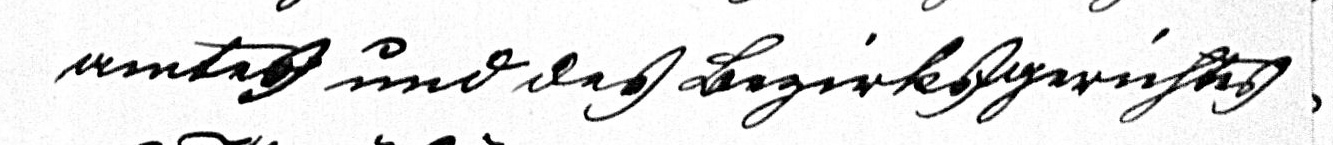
amtes und des Bezirksgerichtes
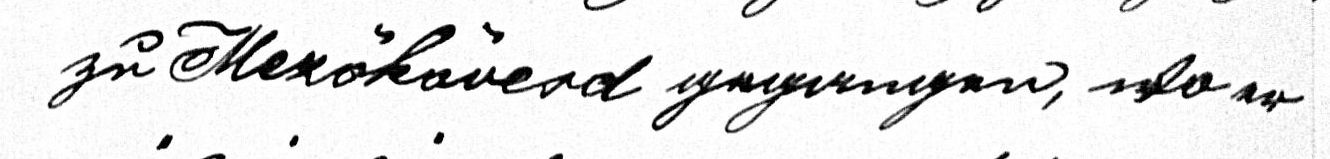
zu Mezökövesd gegangen, wo er
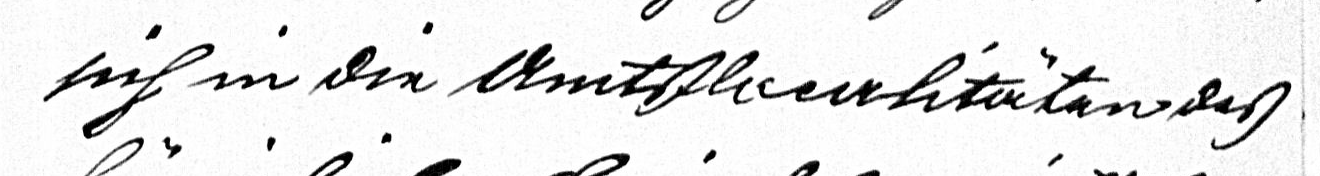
sich in die Amtslocalitäten des
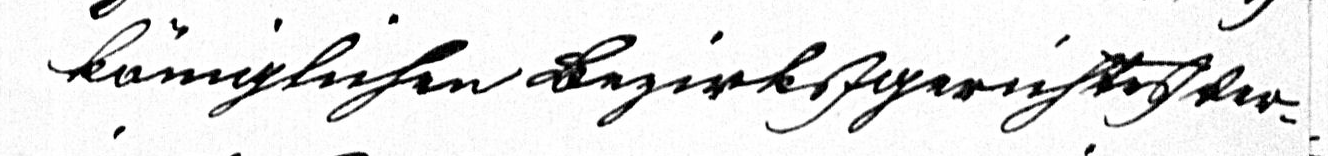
königlichen Bezirksgerichtes ver¬
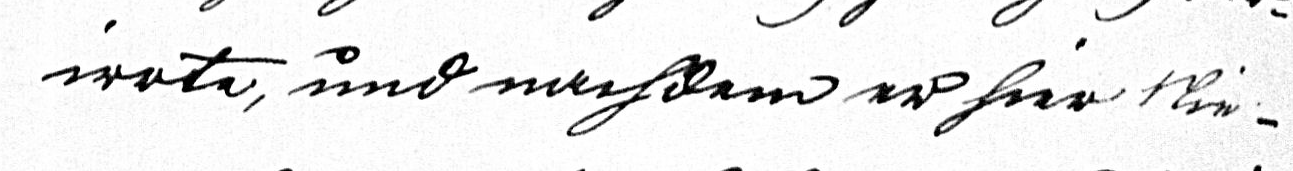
irrte, und nach dem er hier Nie¬
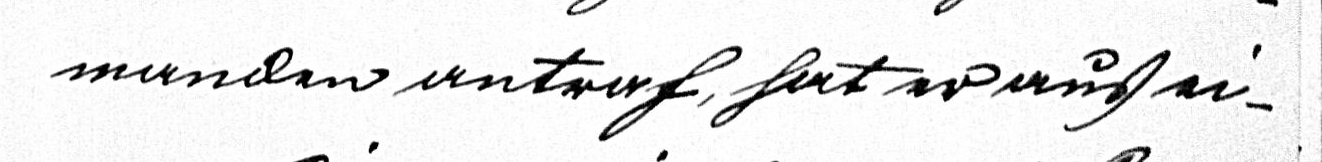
manden antraf, hat er aus ei¬
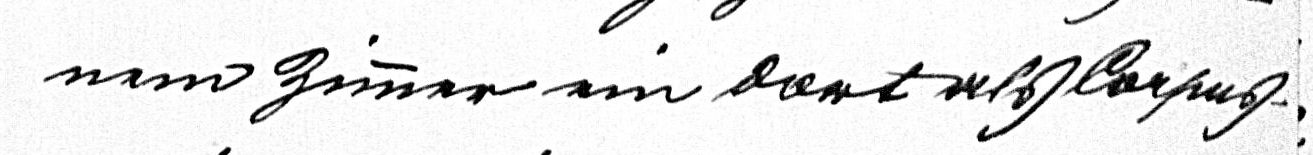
nem Zimmer ein dort als Corpus¬
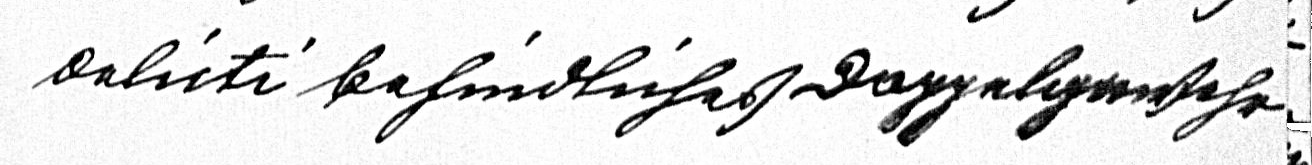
delicti befindliches Doppelgewehr
